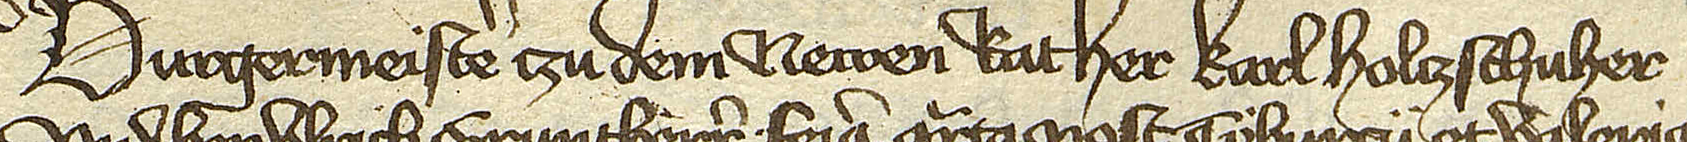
Burgermeiſte* cʒu dem Newen Rat Her Karl holcʒſchuher
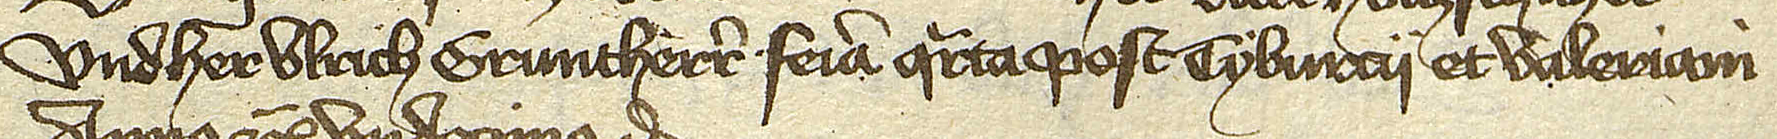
vnd her Vlrich Gruntherr* feia* qrta* poſt Tyburcii et Valeriani
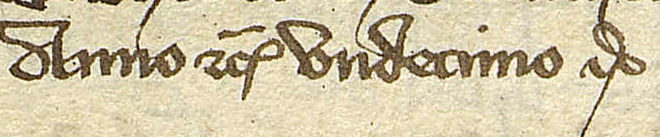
Anno ec* vndecimo §
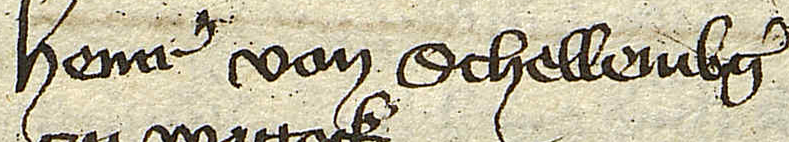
heinr* von Schellembg*
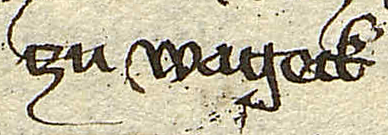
cʒu wageck
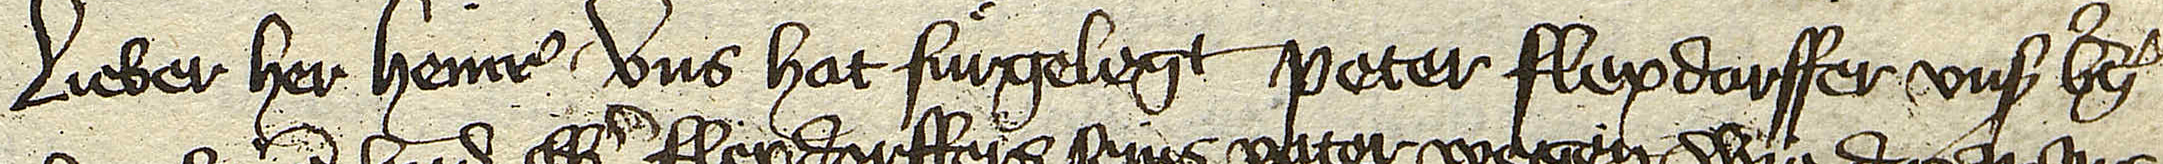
Lieber her heinr* / Vns hat fürgelegt Peter flexdorffer vnſ* b*g*
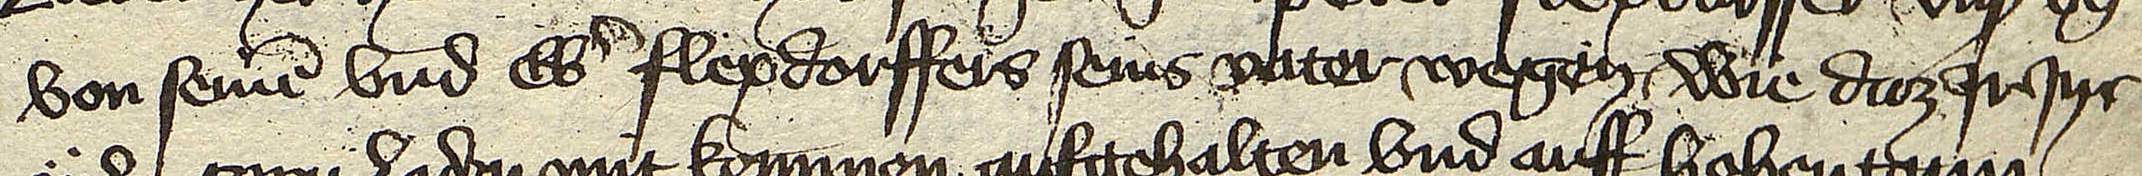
von ſeine* vnd Eb* flexdorffers ſeins vater wegen / wie daʒ Ir Im
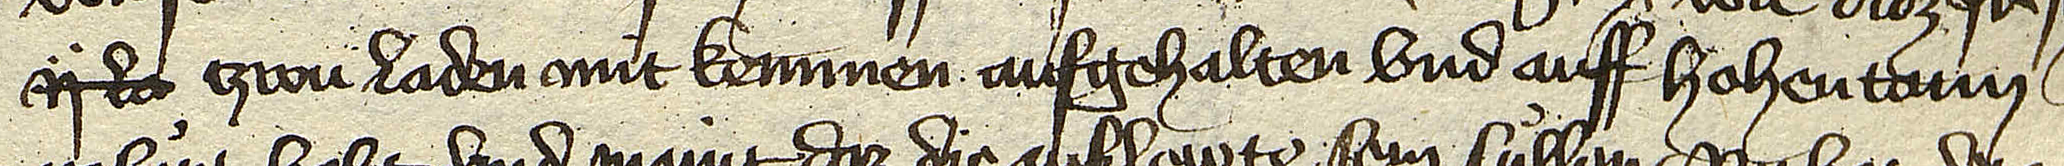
in la cʒwu laden mit kemmen aufgehalten vnd auff hohentann
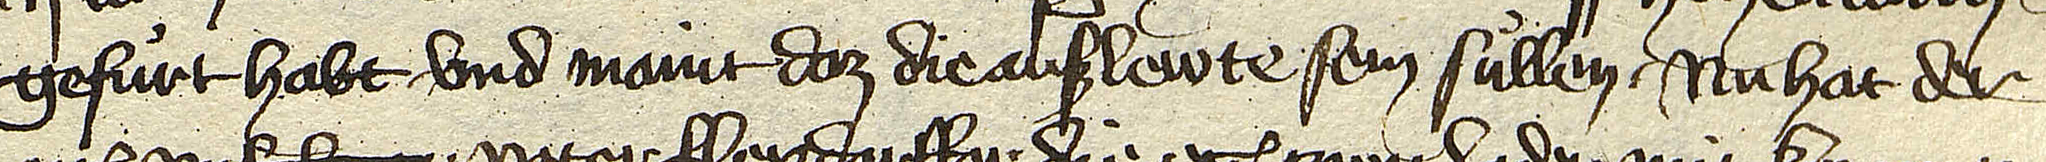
gefürt habt / vnd maint daʒ die auſʒlewte ſein ſüllen / Nu hat der
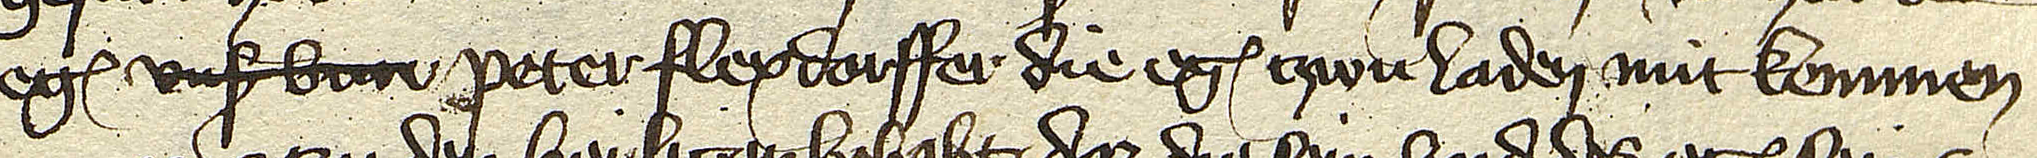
eg* vnſ* burg Peter flexdorffer die eg* cʒwu laden mit kemmen
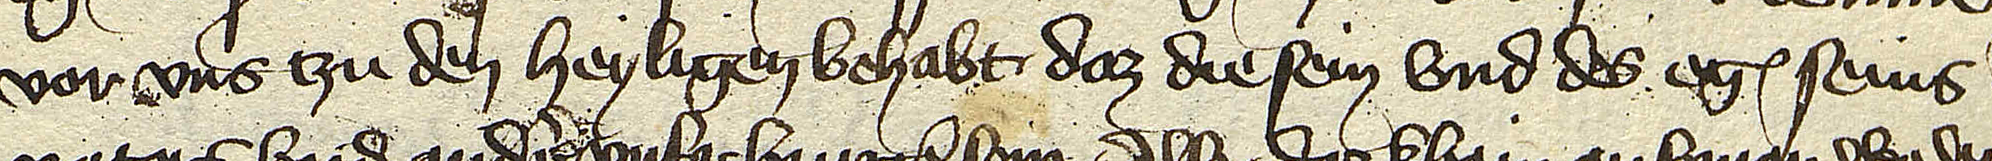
vor vns cʒu den heyligen behabt / daʒ die ſein vnd des eg* ſeins
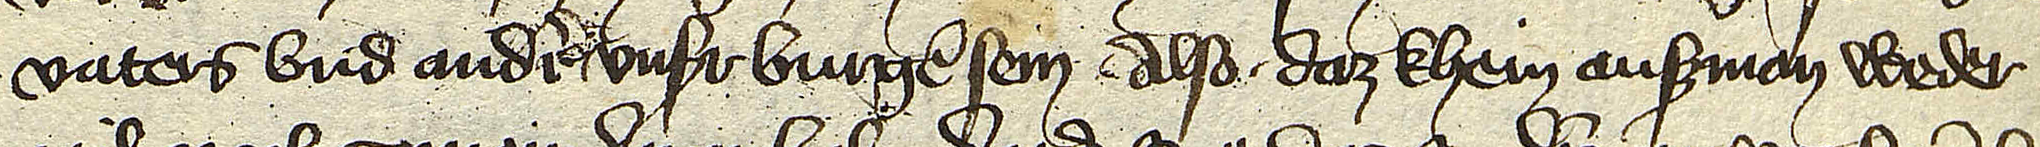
vaters vnd andr* vnſ*r burge* ſein / Alſo / daʒ khein auſʒman weder
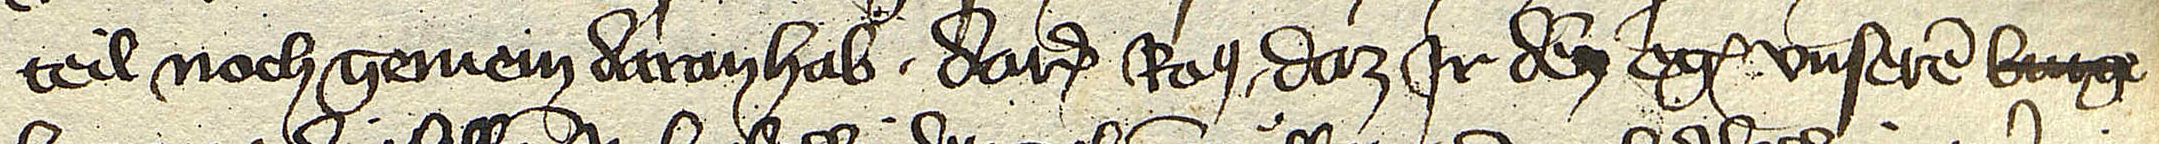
teil noch gemein daran hab / dar*Ro* / daʒ Ir den eg* vnſere* burge
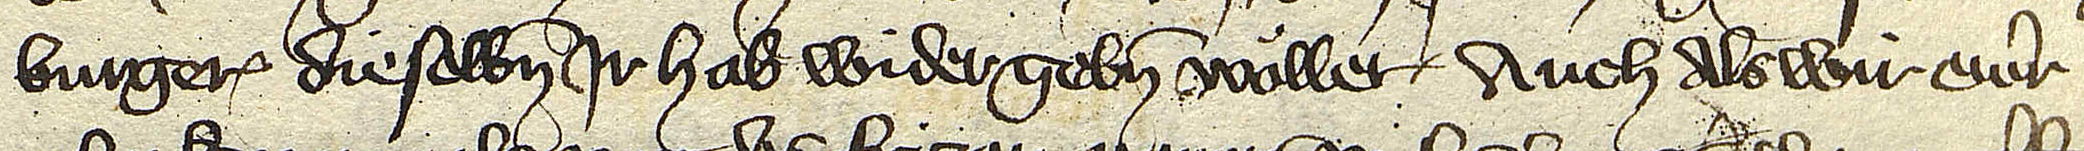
burger* dieſelbn* Ir hab widergebn* wöllet / Auch als wir ew*r
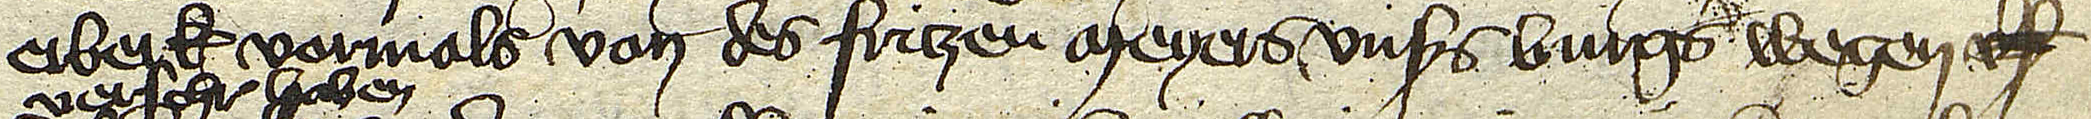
erberk* vormals von des fricʒen Meyers vnſ*s burgs* wegen v*ſ*
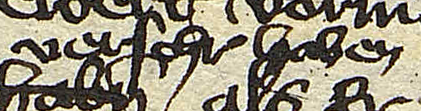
verſchr* haben
